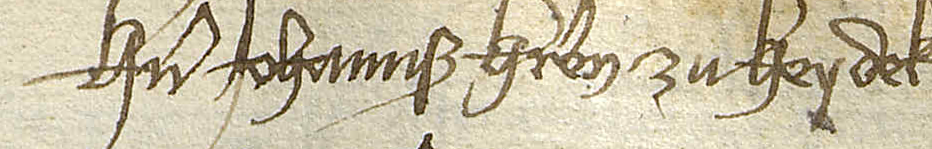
Hn* Iohannſ* h*ren ʒu Heydek
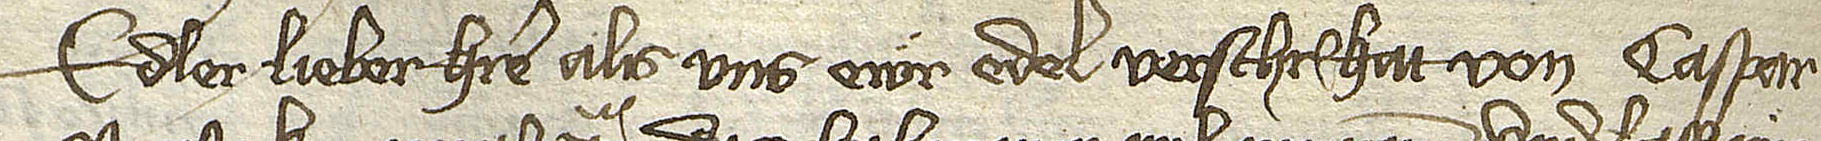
Edler lieber hre* als vns ewr edel verſchr* hat von Caſpar
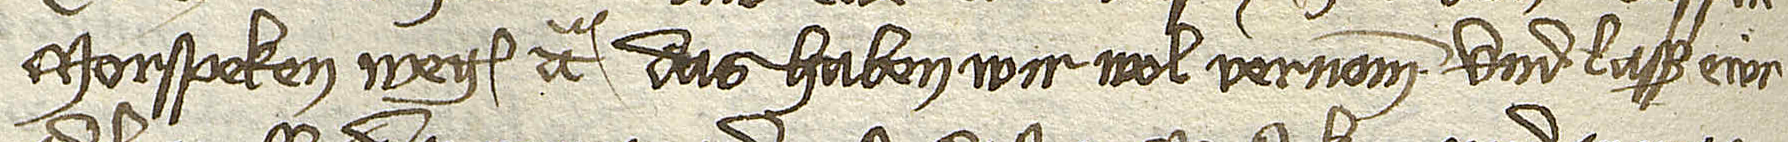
Morſpeken weg* ec* das haben wir wol vernom* . Vnd laſſ* ewr
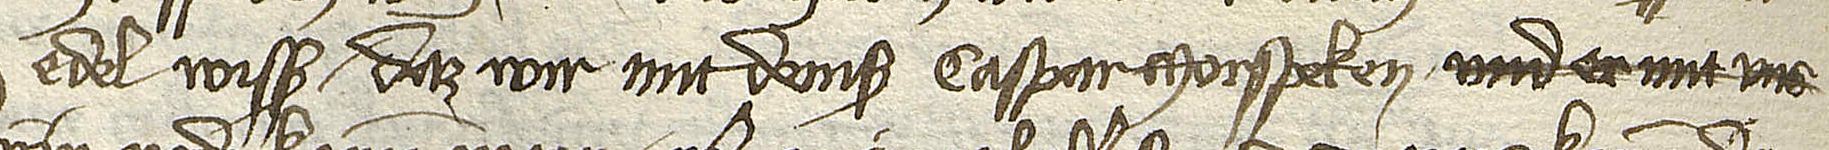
edel wiſſ* / daʒ wir mit demſ* Caſpar Morſpeken vnd er mit vns
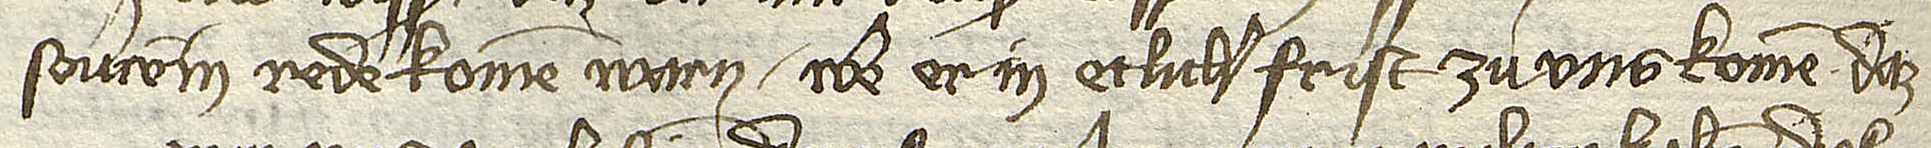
ſou*re* in rede kome* warn / we* er in etlich* friſt ʒu vns kome* . daʒ
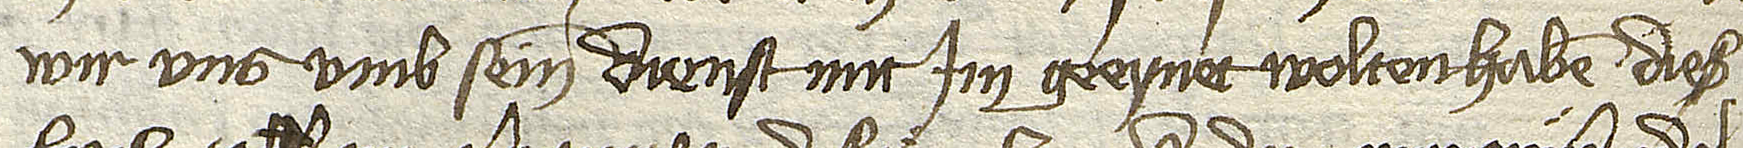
wir vns vmb ſein* dienſt mit Im geeynet wolten habe* dieſ*
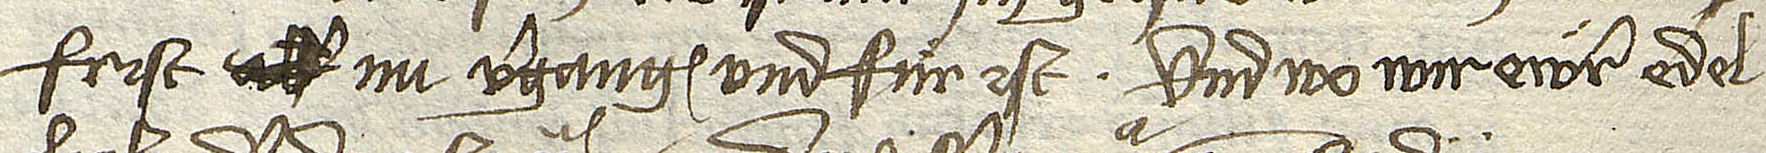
friſt ab* nu v*gang* vnd für iſt . Vnd wo wir ewr* edel
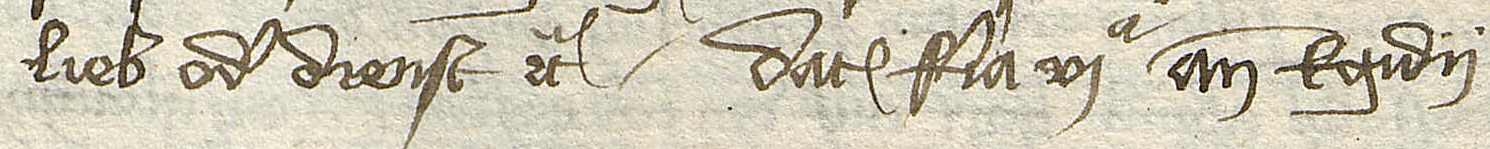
lieb od* dienſt ec* / Dat* fia* vi* an* Egidii
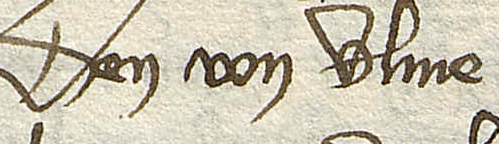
Den von Vlme
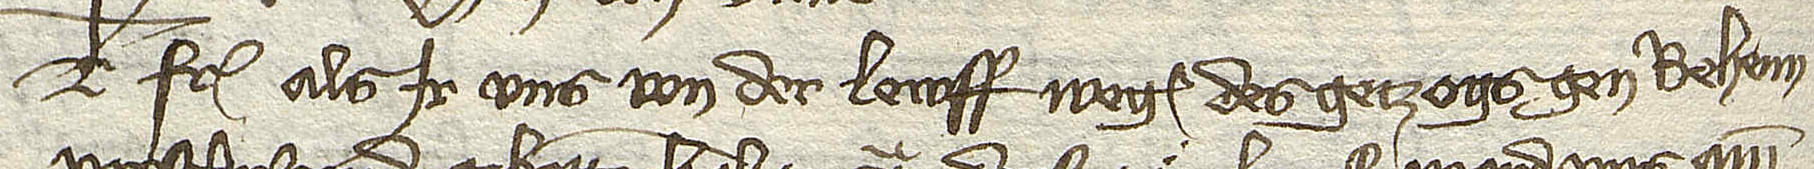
L* fr* als Ir vns von der lewff weg* des gecʒogs gen Beheim
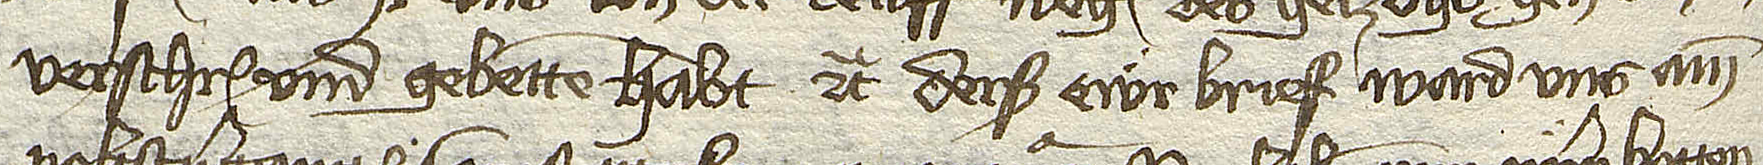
verſchr* vnd gebette* habt ec* derſ* ewr brief ward vns am*
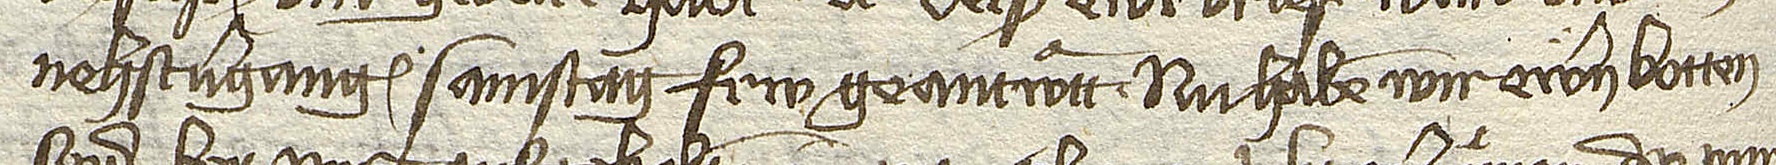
nehſtu*gang* ſamſtag frw geantw*tt . Nu habe* wir ew*n botten
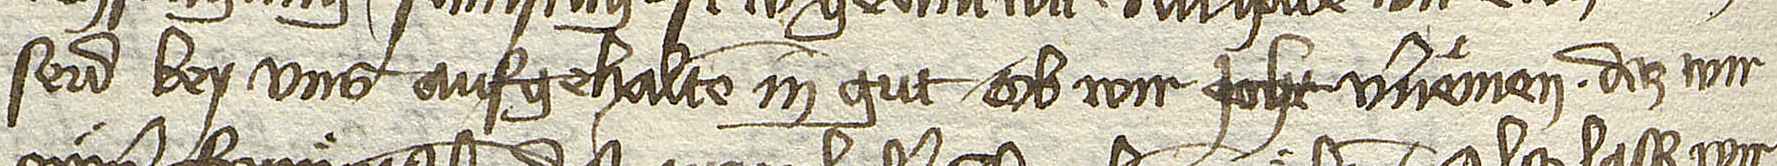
ſeid bey vns aufgehalte* in gut / Ob wir Icht v*nëmen . daʒ wir
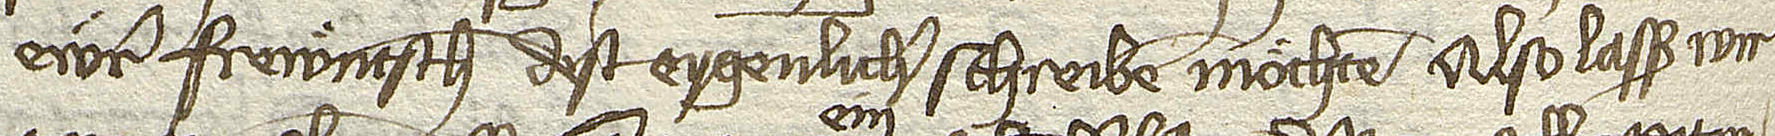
ewr* frewntſch* deſt eygenlich* ſchreibe* möchte* Alſo laſſ* wir
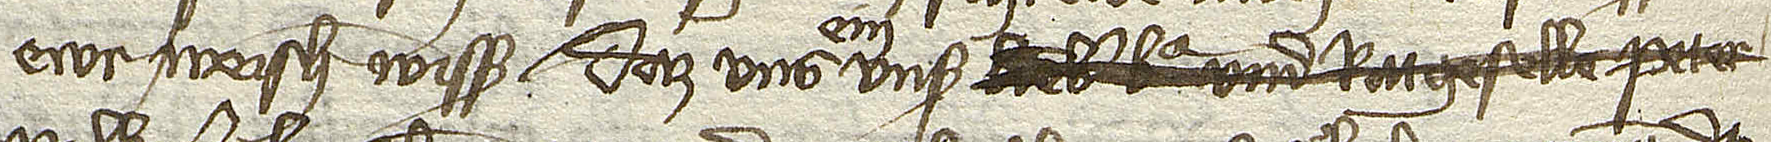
ewr weiſh* wiſſ* / Daʒ vns vnſ* lieb* b* vnd Ratgeſelle Peter
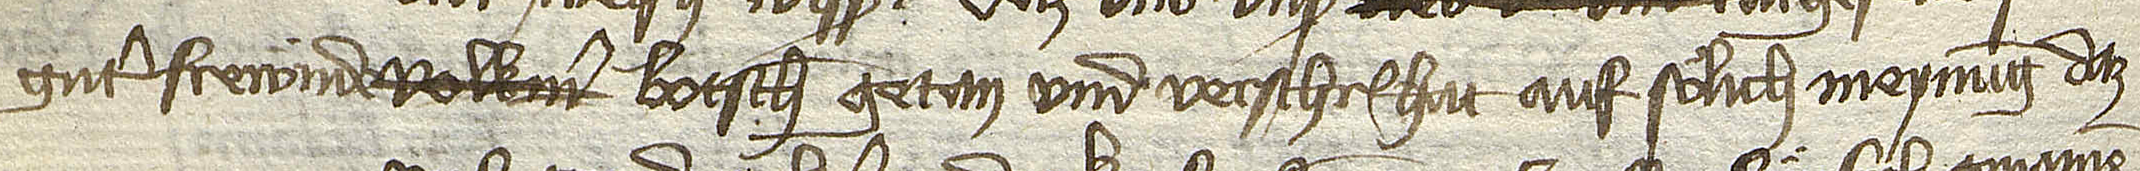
gut* frewnde volkm* botſch* getan vnd verſchr* hat auf ſölich meynug* daʒ
